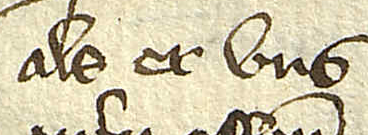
als er vns
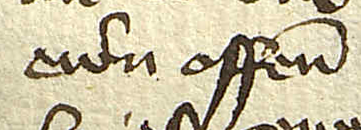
ew*n offen*
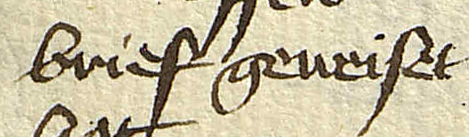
brief geweiſet
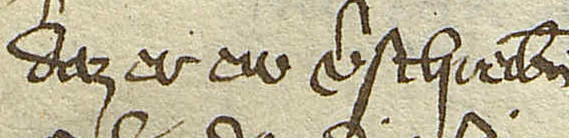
daʒ er ew v*ſchreibn*
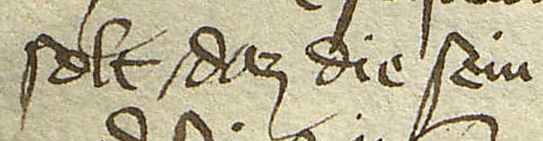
ſolt / daʒ die ſein
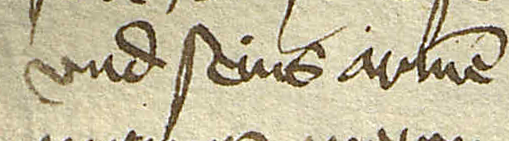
vnd ſeins arme*
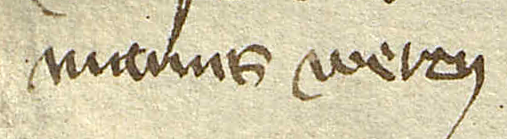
manns weren
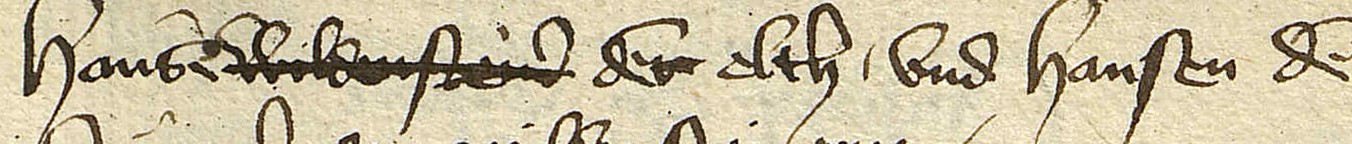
Hans Wildenſtein der* eltn* / vnd Hanſen d*
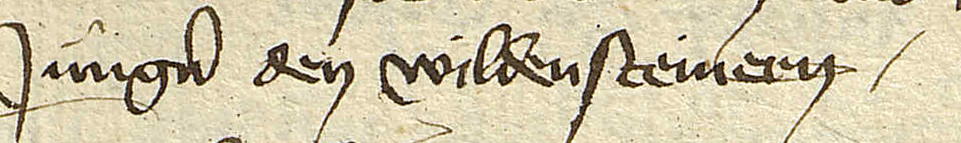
Iüngn* den wildenſteinern /
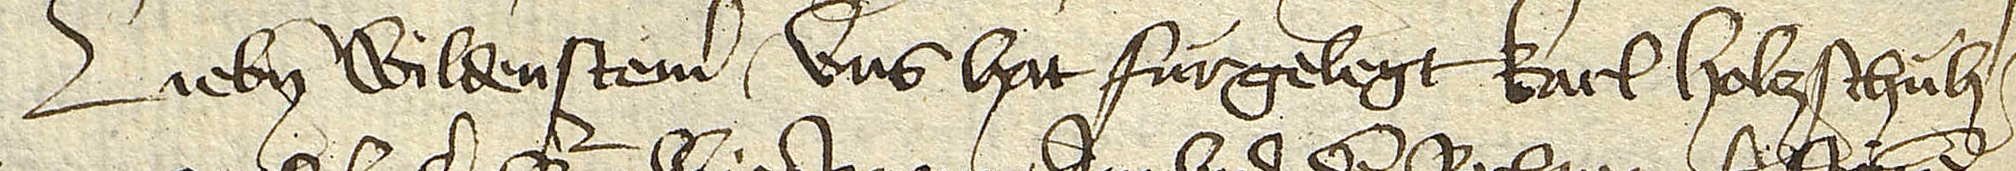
Liebn* wildenſtein* / vns hat fürgelegt Karl Holcʒſchüh*
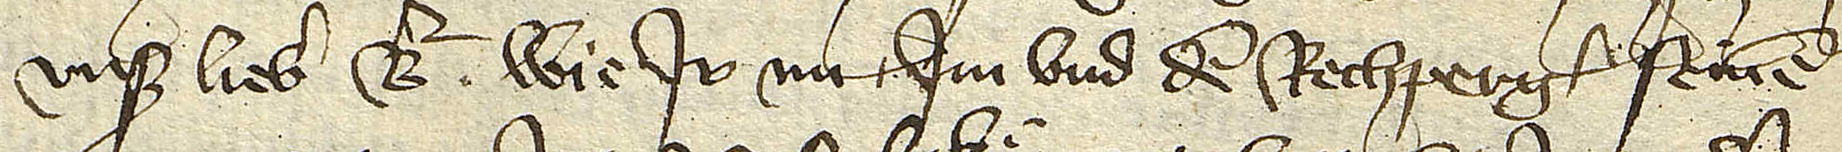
vnſ* lieb* B* . wie Ir nu / Im vnd d* Rechperg* ſeine*
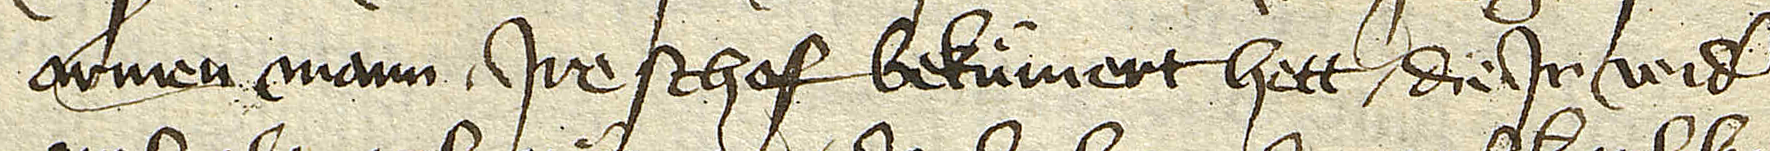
armen mann / Ire ſchof bekümert hett / die Ir wid*
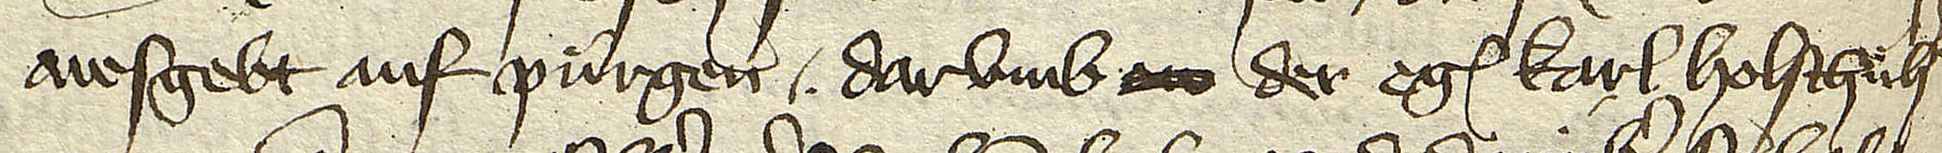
awſgebt auf pürgen /. darvmb ew der eg* karl holſchüh*
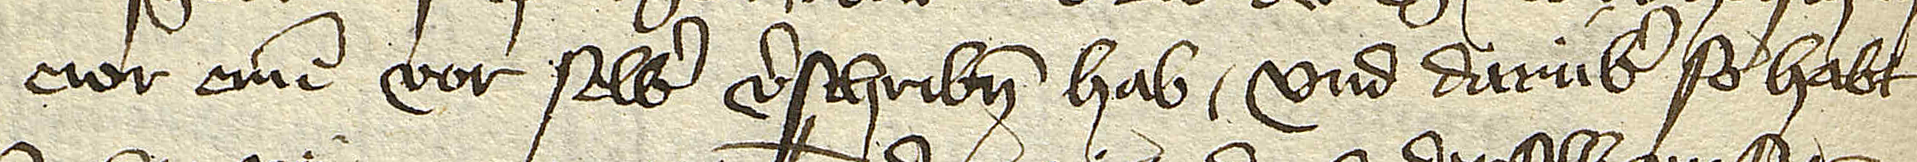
ewr eine* vor ſelb* v*ſchribn* hab / vnd darüb* ſo habt
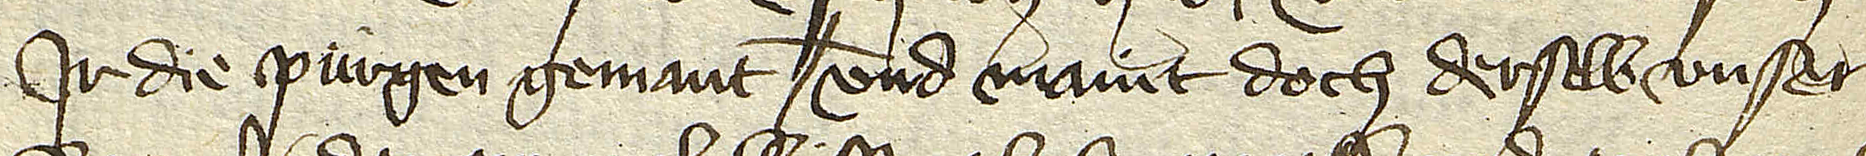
Ir die pürgen gemant vnd maint doch derſelb vnſer
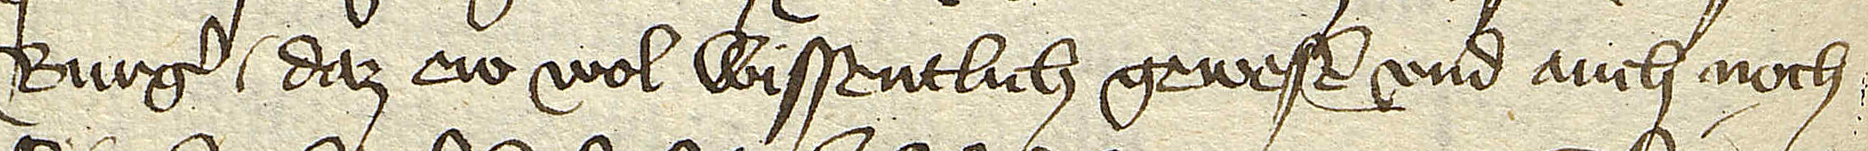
Burg* / daʒ ew wol wiſſentlich geweſe* vnd auch noch
